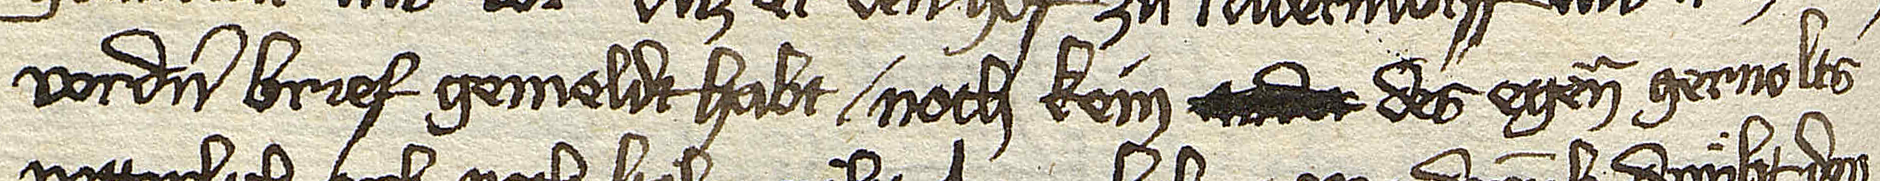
vordn* brief gemeldt habt / noch kein ander des egen* gernolts
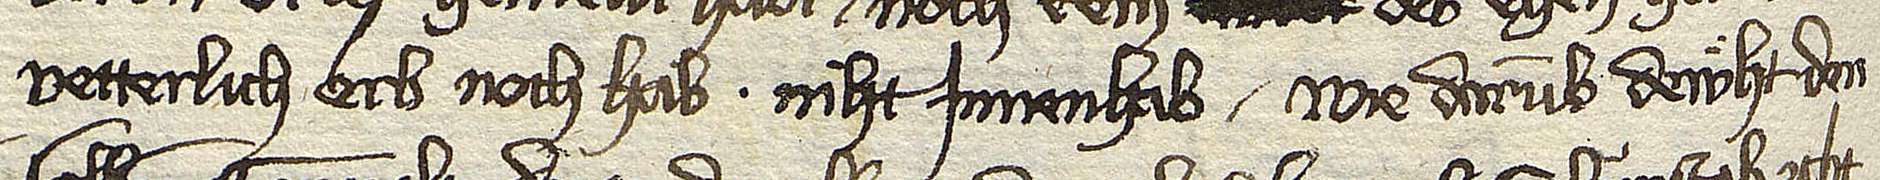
vetterlich erb noch hab . niht Innenhab / wie darub* deẅht den
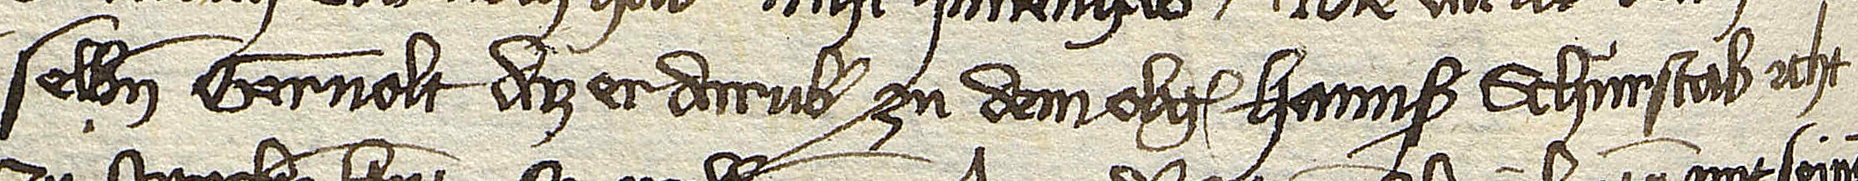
ſelbn* Gernolt daʒ er darub* ʒu dem obg* hannſ* Schürſtab icht
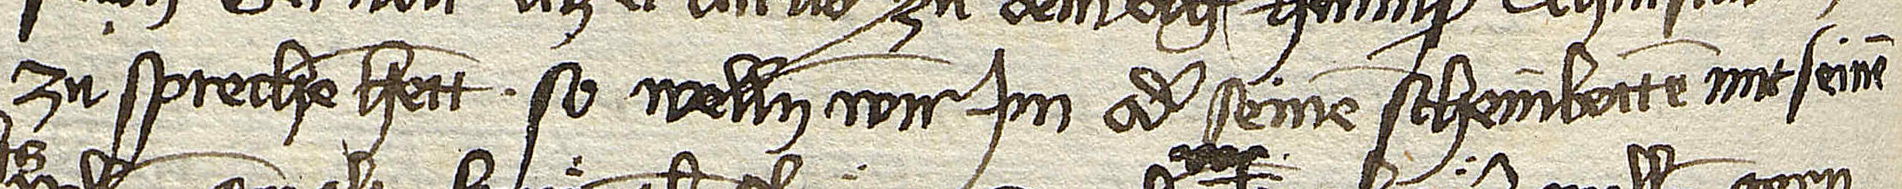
ʒu ſpreche* hett . ſo welln* wir Im od* ſeine* ſcheinbotte* mit ſeine*
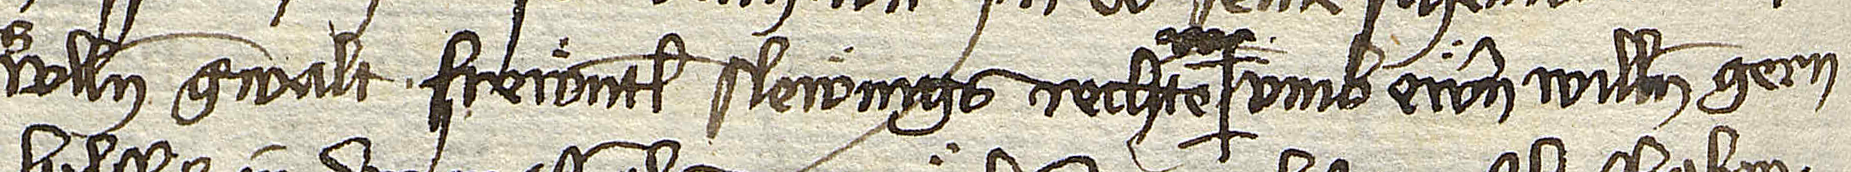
volln* gwalt . freẅntl* ſleẅnigs rechte vmb eẅ*n willn* gern
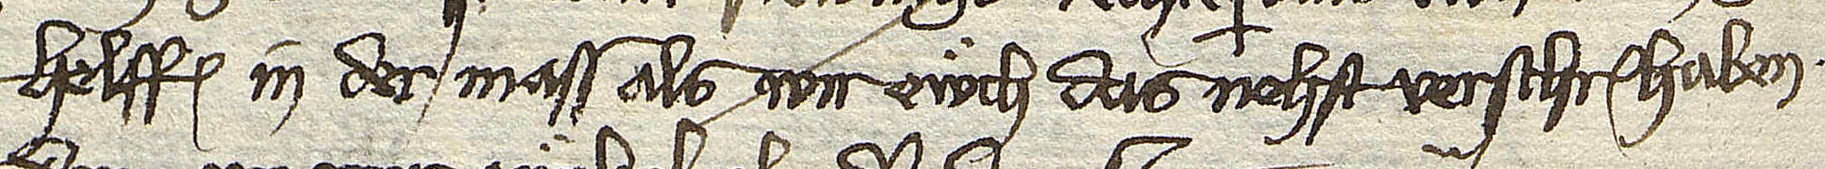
helff* in der maſſ als wir eẅch das nehſt verſchr* haben
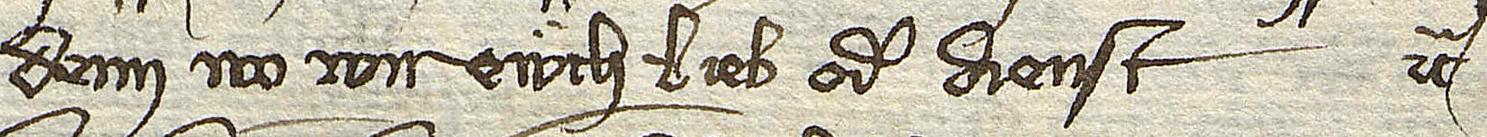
denn wo wir eẅch lieb od* ec*
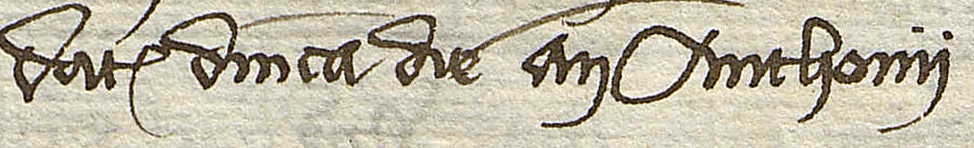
Dat* dnica* die an* Anthonii
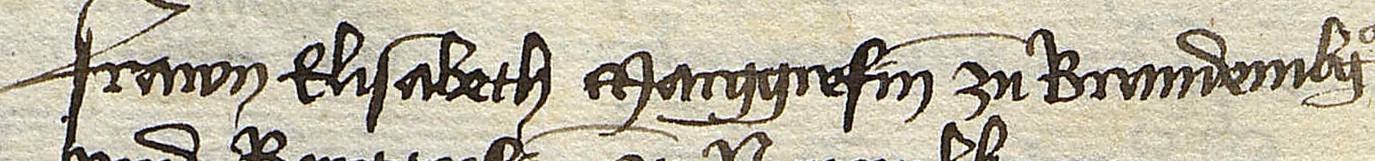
Frawn Eliſabeth Marggrefin* ʒu Brandemb*g
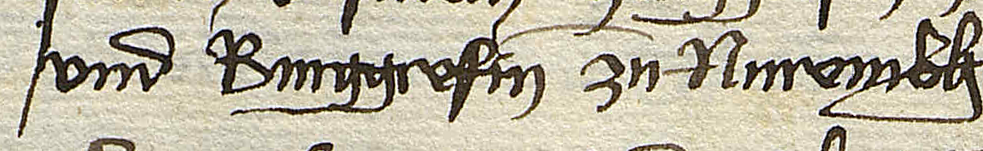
vnd Burggrefin* ʒu Nuremb*g
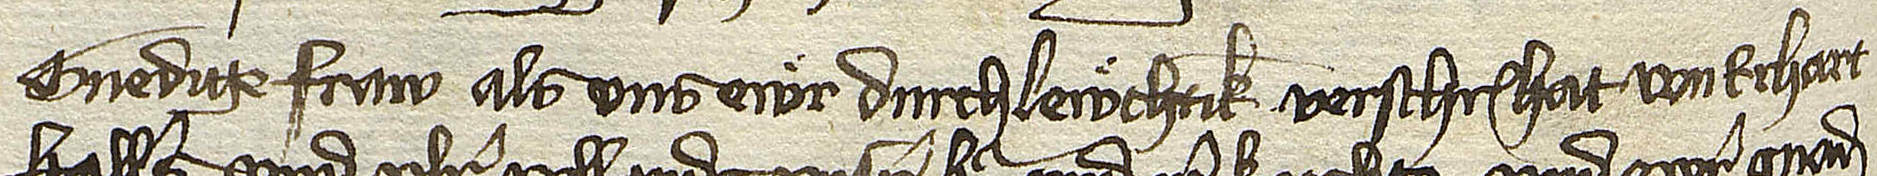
Gnedige Fraw als vns eẅr durchleẅchtik* verſchr* hat von Erhart
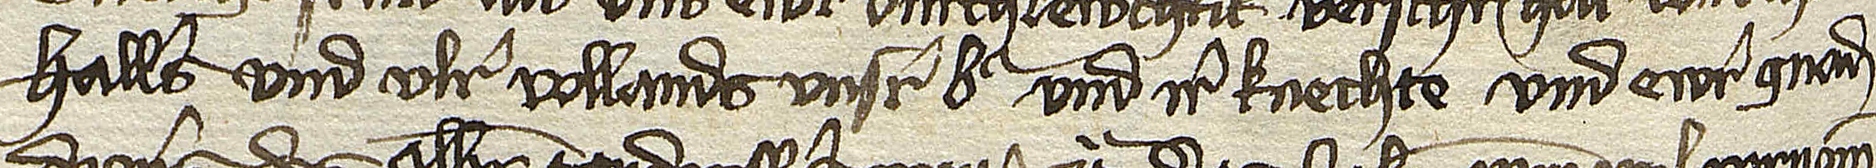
Hall*s vnd vlr* vollands vnſr* b* / vnd ir* knechte vnd ewr* gnad*
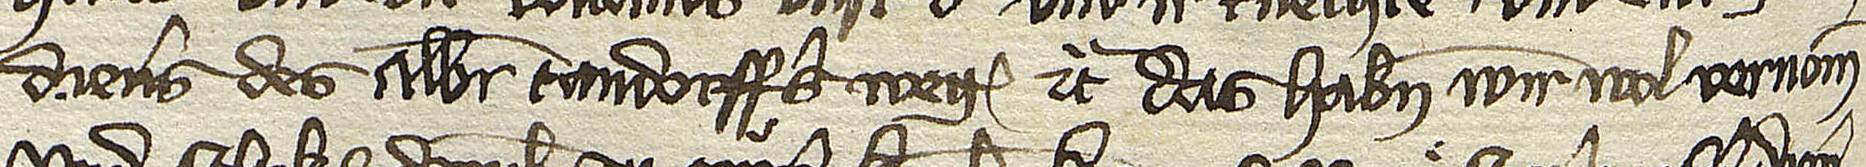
dien*s des albr* tandorff*s weg* ec* das habn* wir wol vernom*
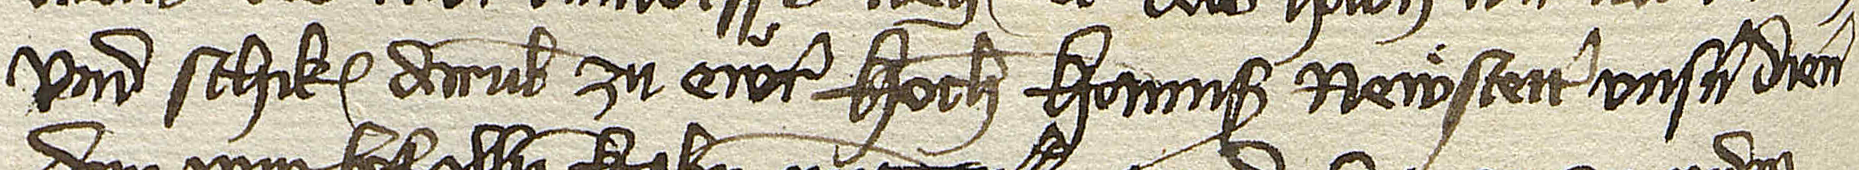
vnd ſchik* darub* ʒu eẅr* Hoch* Hannſ* Neẅſtett* vnſn* dien*
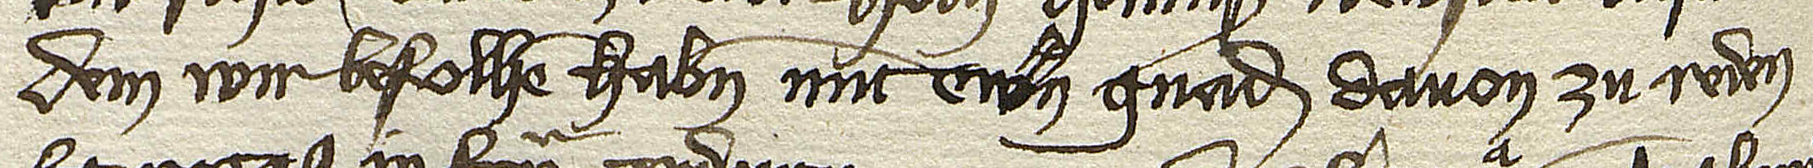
Dem wir befolhe* habn* mit ew*n gnad* dauon ʒu reden
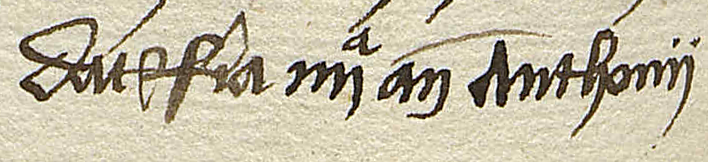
Dat* fi*a iiii* an* Anthonii
